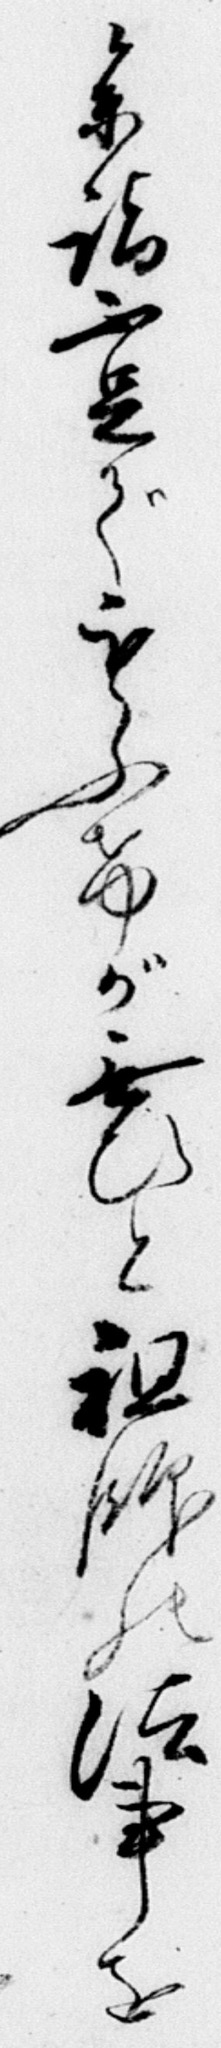参詣不足でもふけが無ひと祖師の法事を
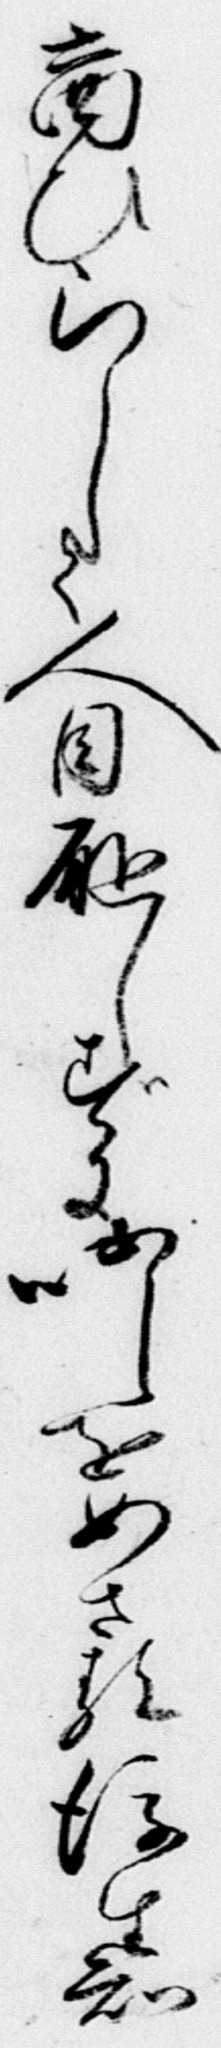商ひらしく一目恥しずに咄しをめさる後生知
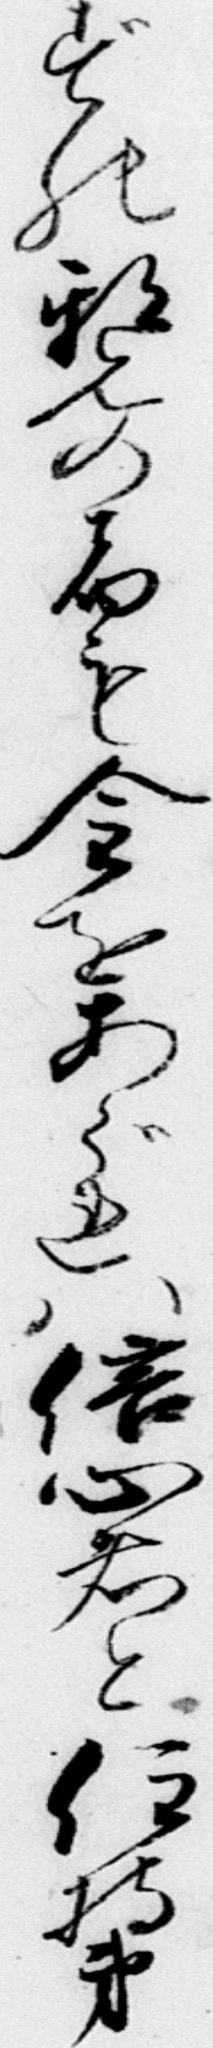ずの新見の者も金をあぐれは信心者と住持弟
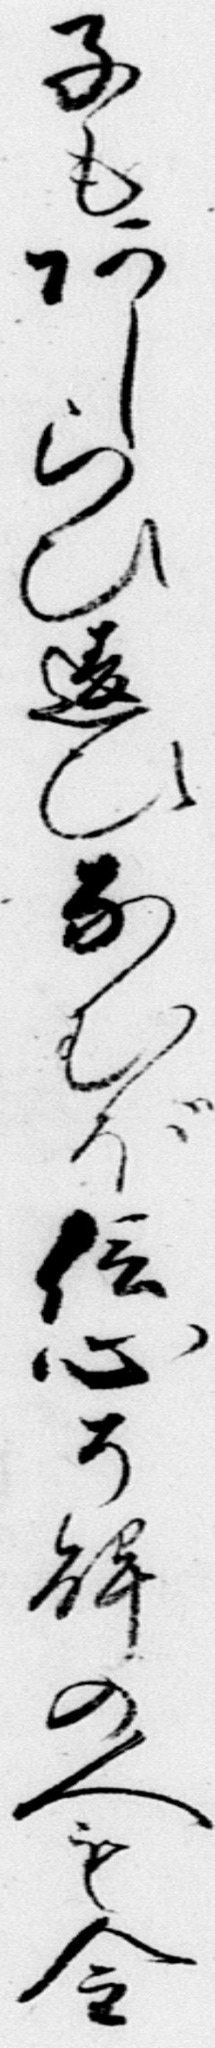子もあしらひ違ひなむぼ信心了解の人も金
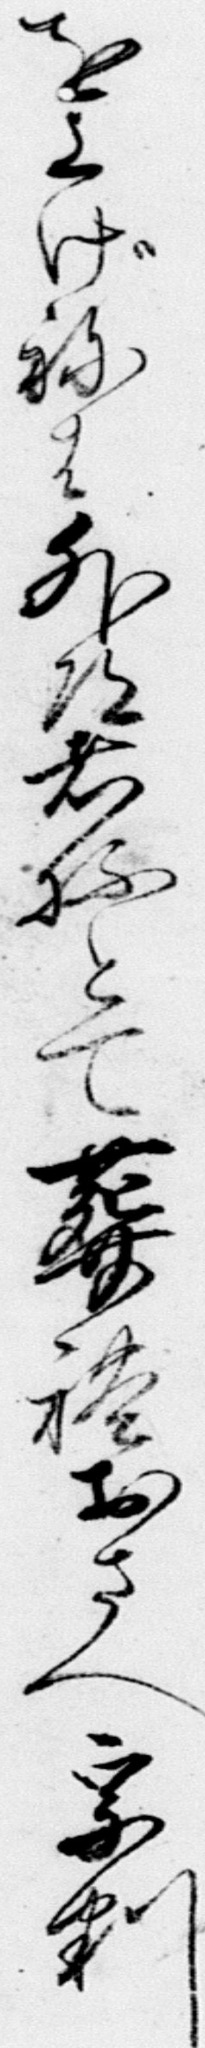を上げねは外道者抔とて葬礼おさへ字判
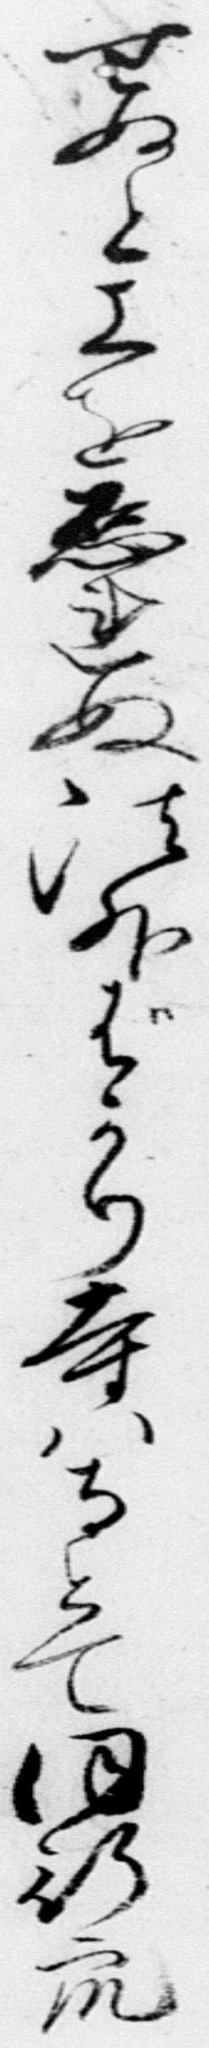せぬと上を恐れぬ法外ばかり寺は寺とて同行衆
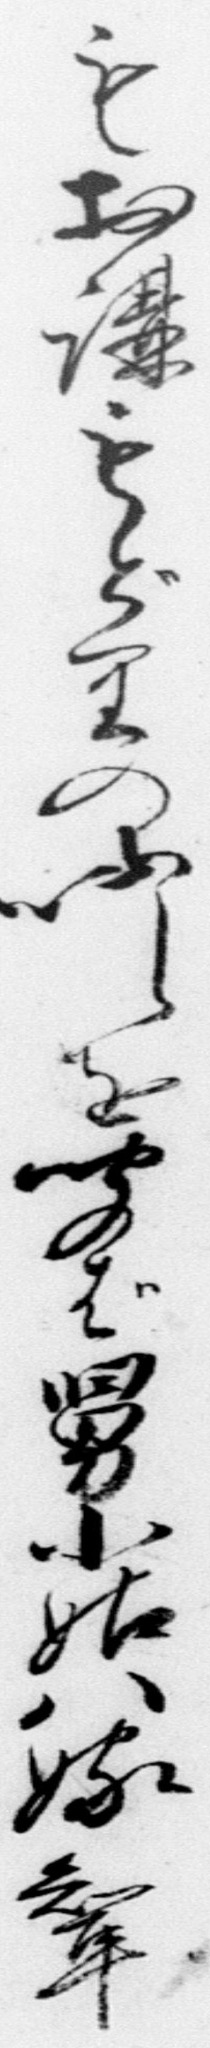もお講もどりの咄しを聞ば舅小姑は嫁聟
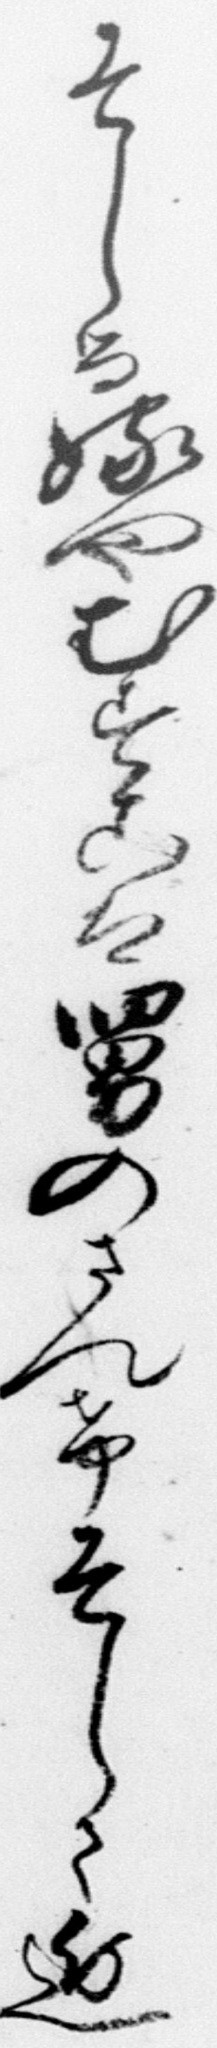そしる嫁やむすこは舅のさんけそして近
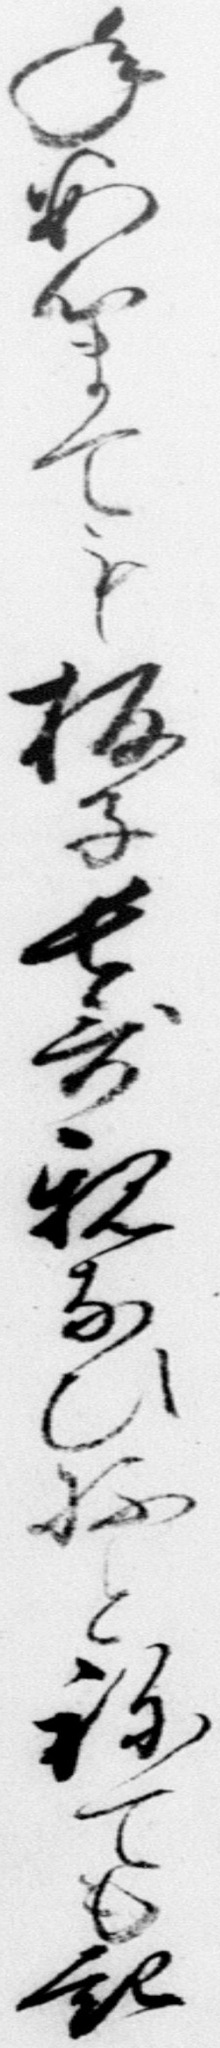年安心まても板子長歌親なひ抔とねても起
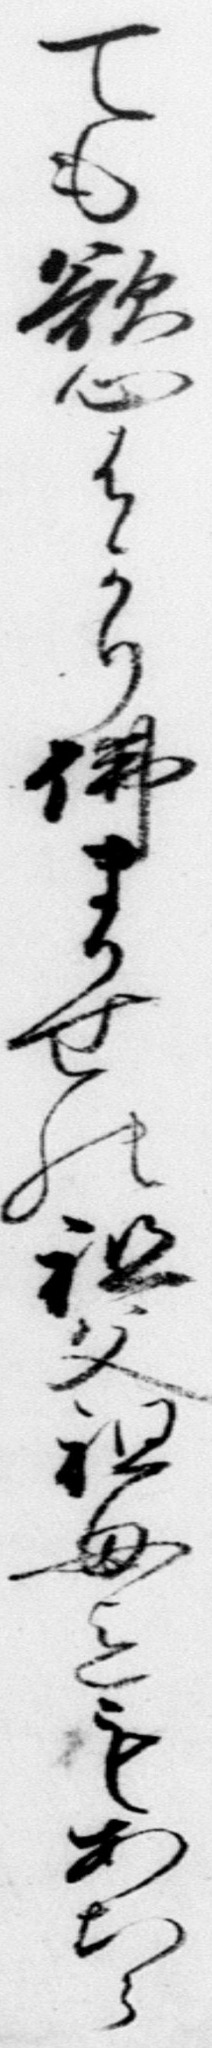ても欲心はかり仏まかせの祖父祖母迄もあちら
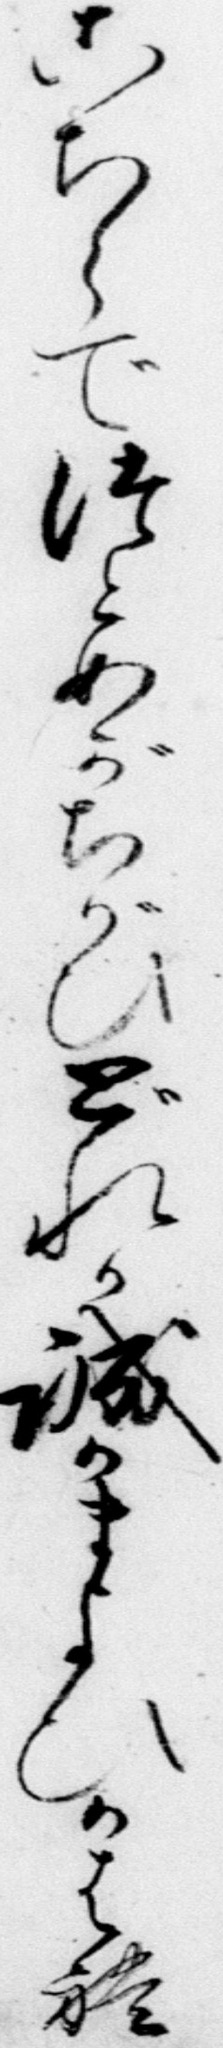こちらでつとめがちがひどれか誠かまよひかはれ
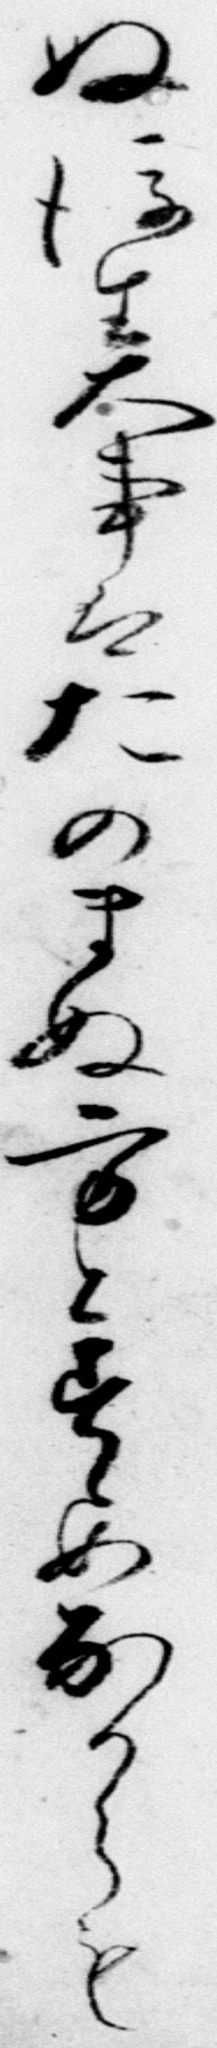ぬ後生大事はたのまぬ方とすゝめなからも

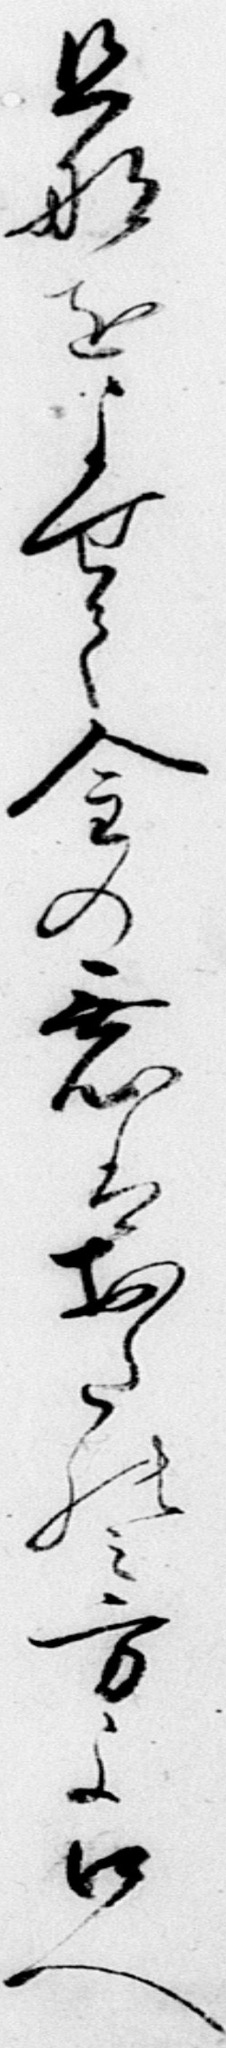旦那をよせて金の無心はおたのみ方よ口へ
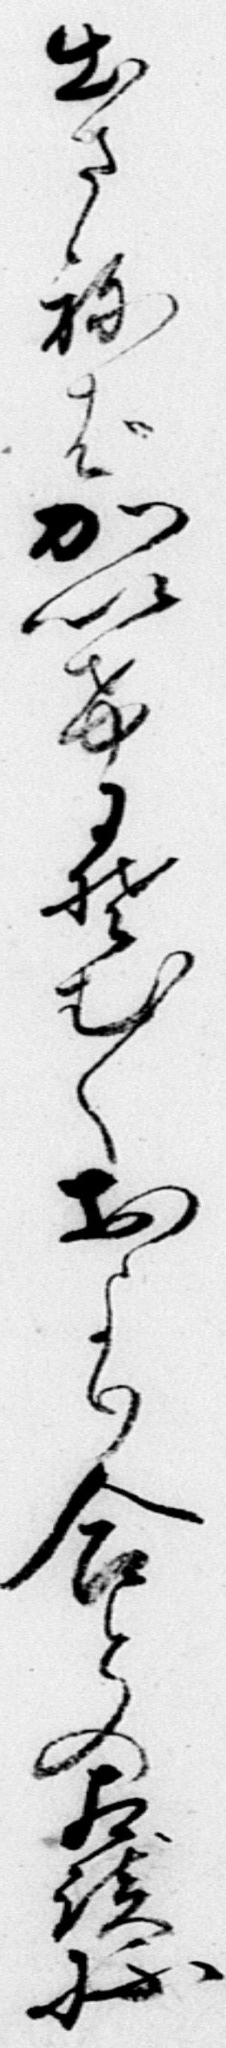出さねばかいけにそむくおより合との相談抔
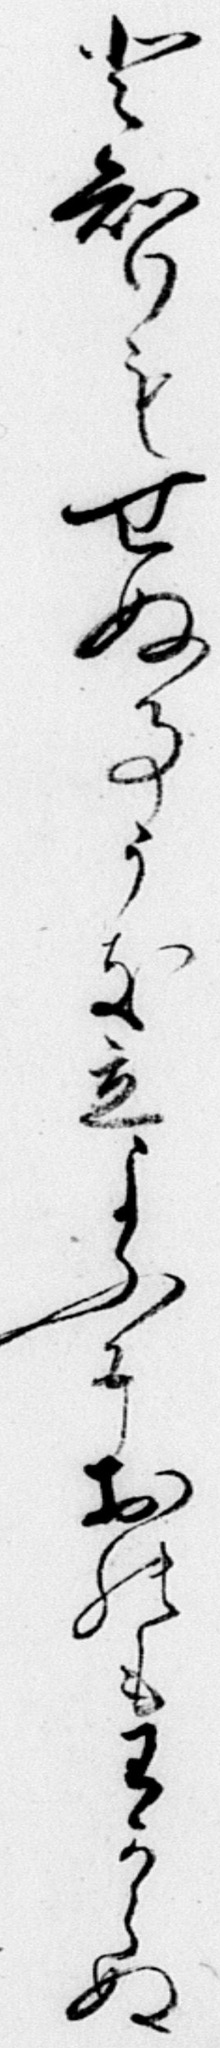と知りもせぬ事うき立よふにおのもわからぬ
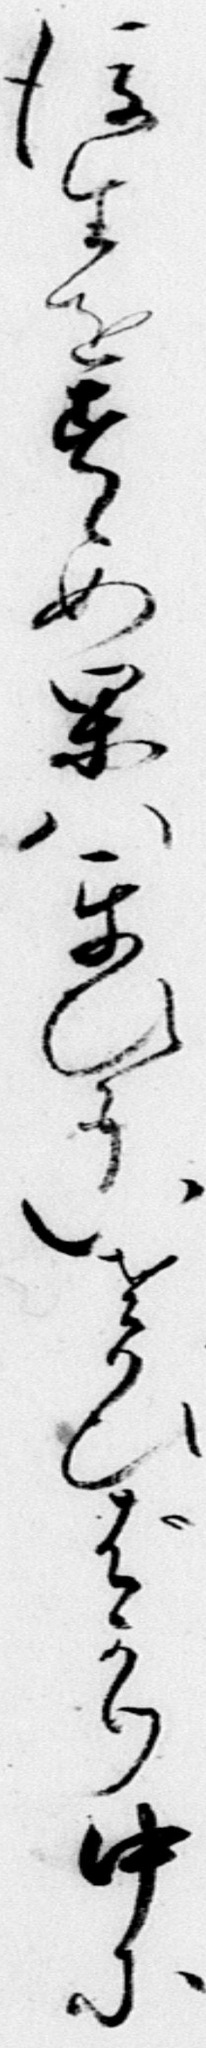後生をすゝめ果は互ひにいさかひばかり中に
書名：越後地震由来
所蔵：徳島県立図書館
